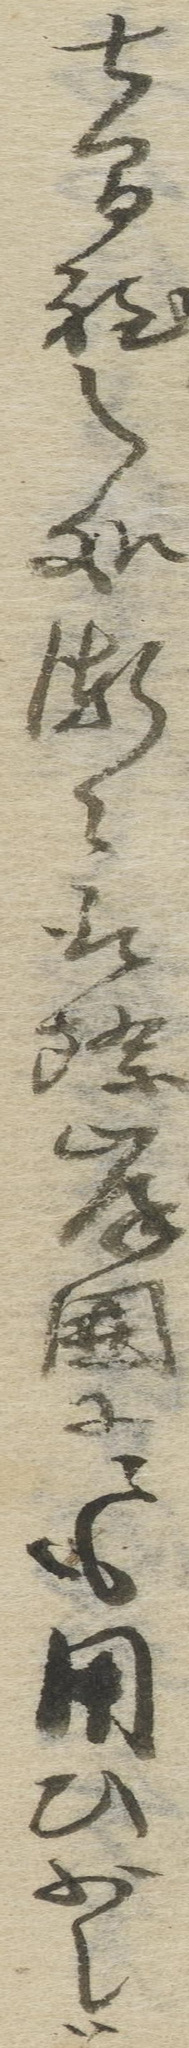七間程之処漸々取除岸囲二而も用ひ少しハ

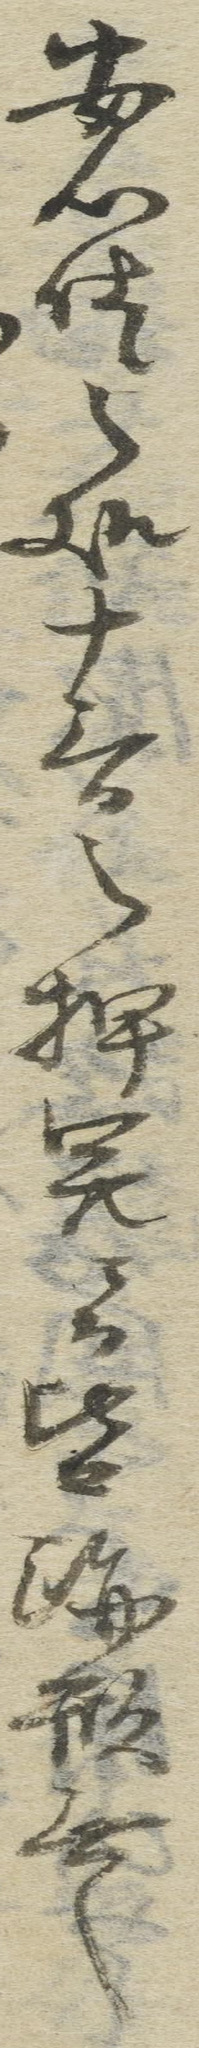安心仕候之処十三日之押冠二而皆流形無之
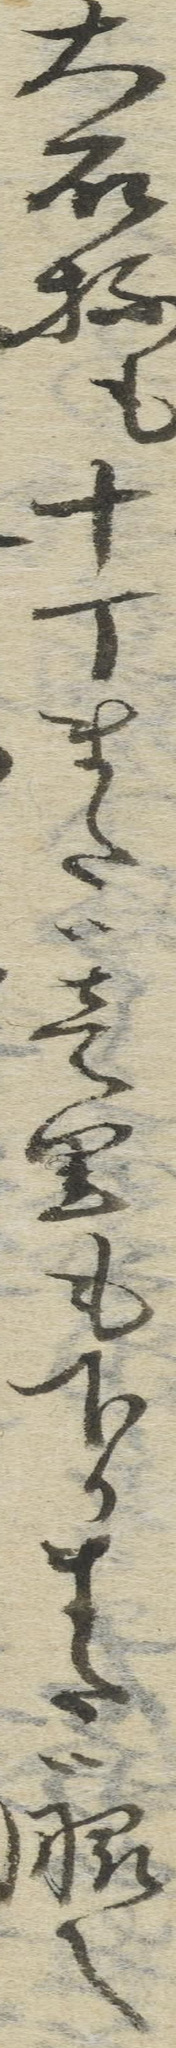大石抔も十丁またハ壱里も下りまたハ脇之
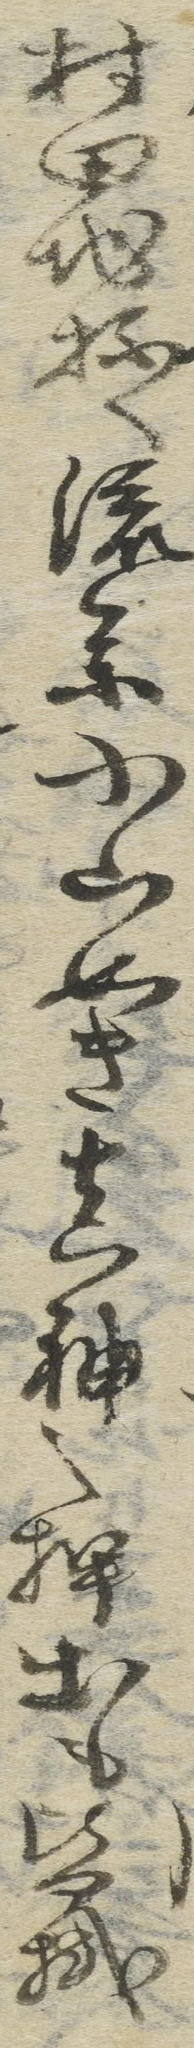村田地抔へ流参小山如き真神之押出も皆掛
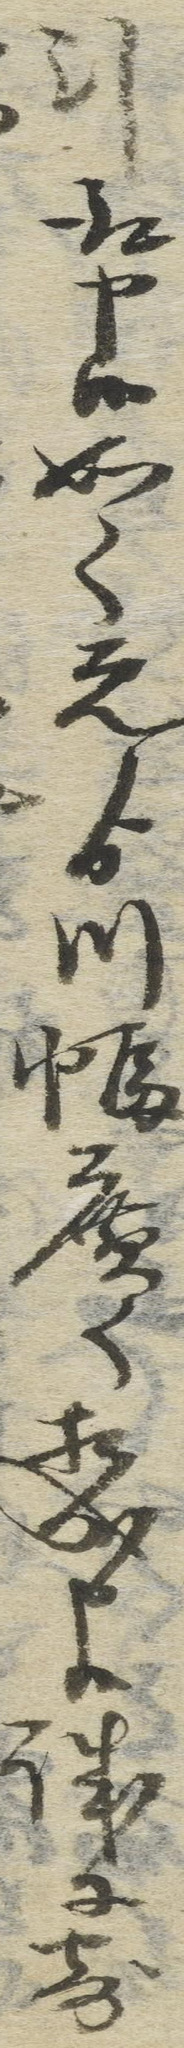引取申候如く元ゟ川幅廣く相成申候事に奇
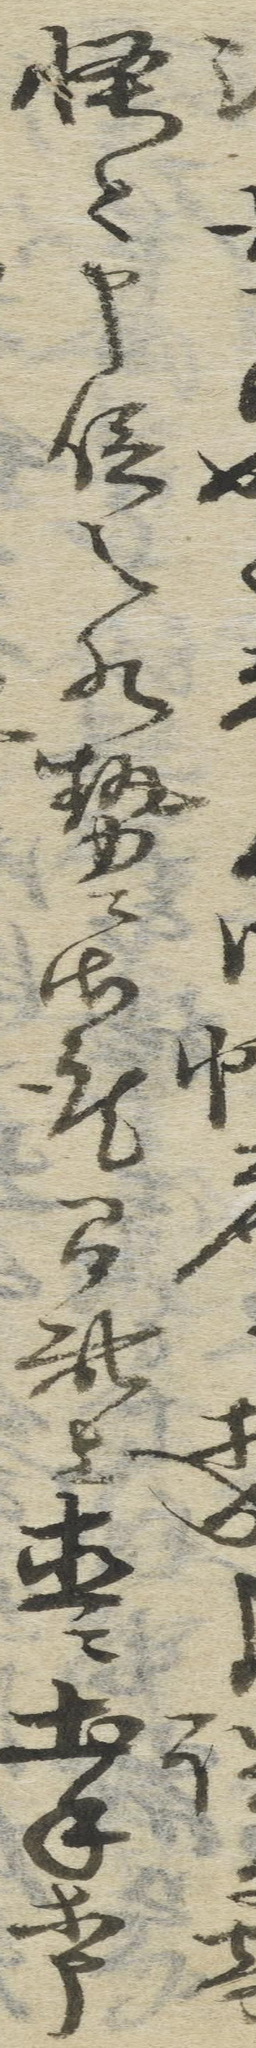怪と申位之水勢二御座候間此上直二土手等申
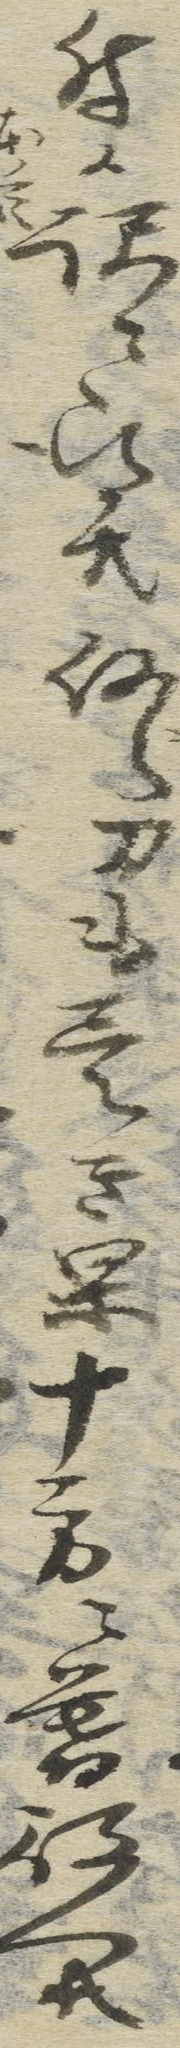付候訳二候得共何分刀も尽き果十方二普役人共
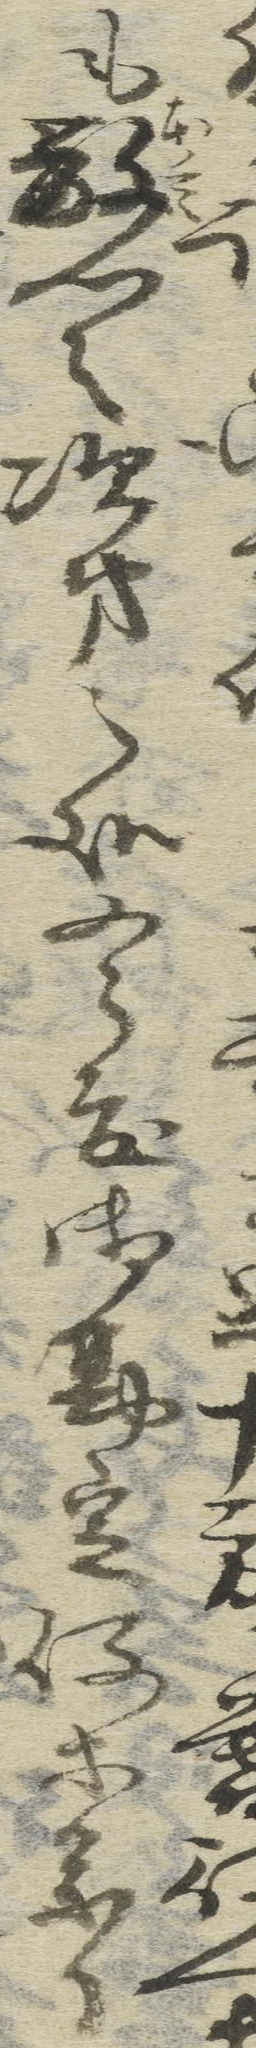も放心之次第之処今度御勘定役等参り
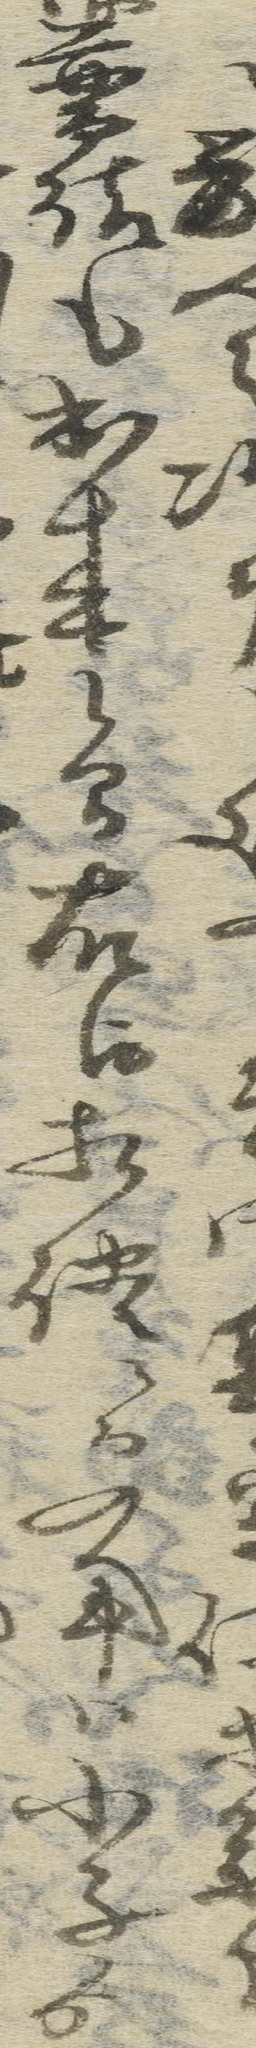御普請も出来候間右江相談二而御用ハ小子ゟ
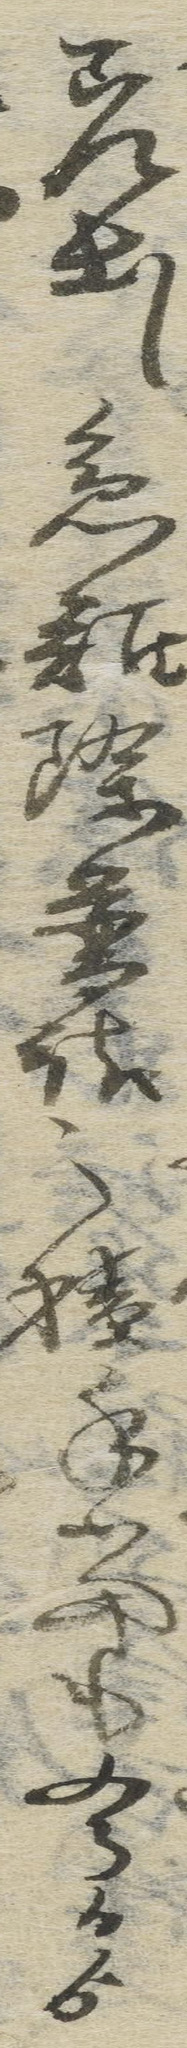差出し急難除普請之積手当も今日ゟ
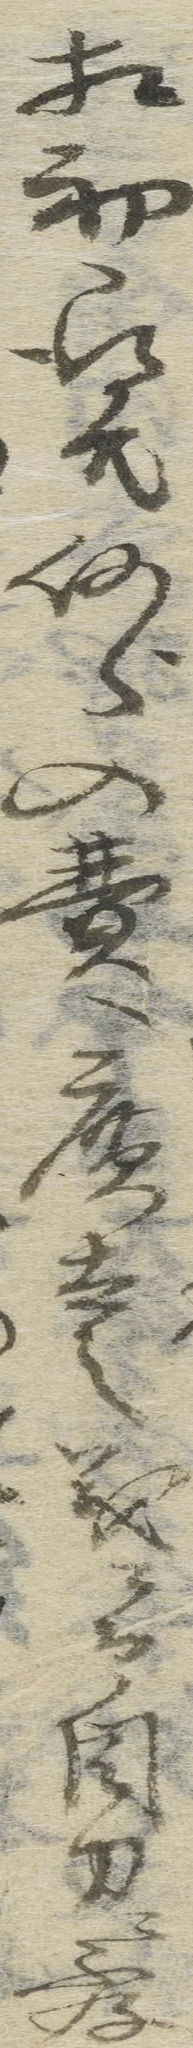相初候得共何分入費へ廣大之義二而自力二不及
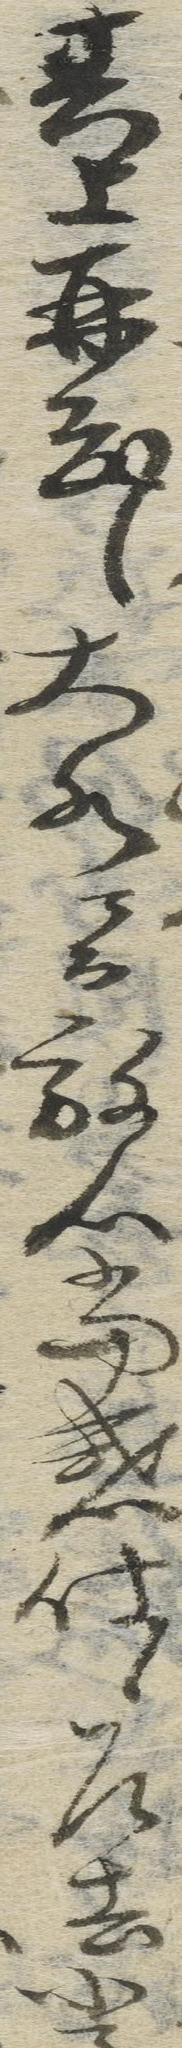其上再度之大水二而放心当惑仕候乍去小子
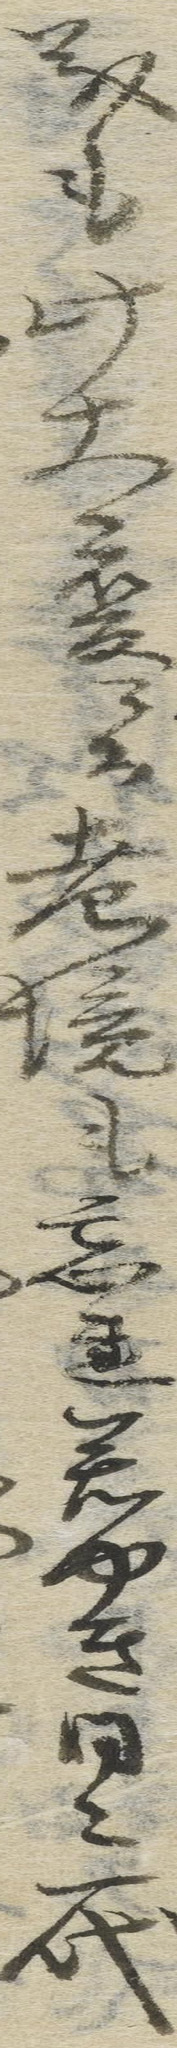義も此大変二而老境も忘れ若ゆき日々一代
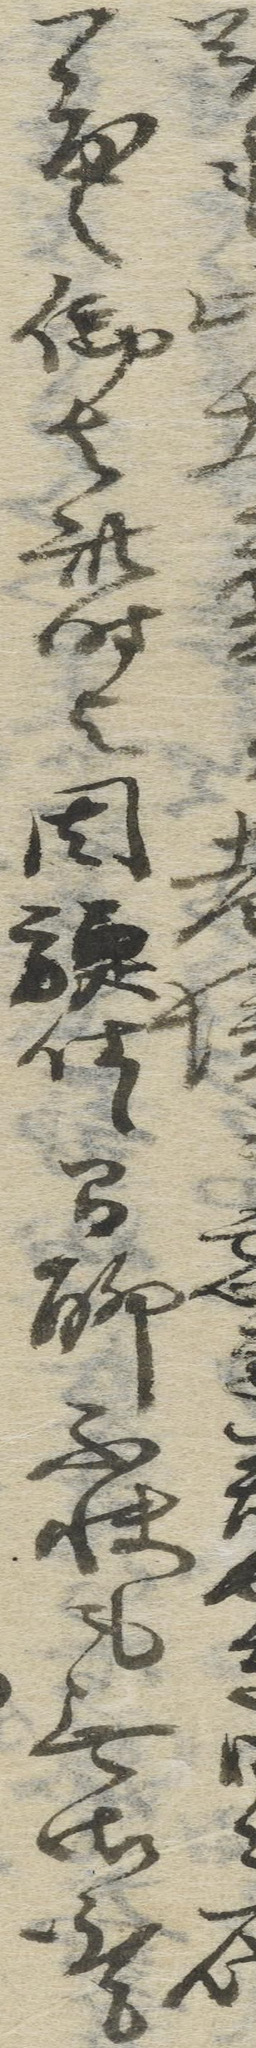可成之働は此時と同族仕候間聊不快も無御座候
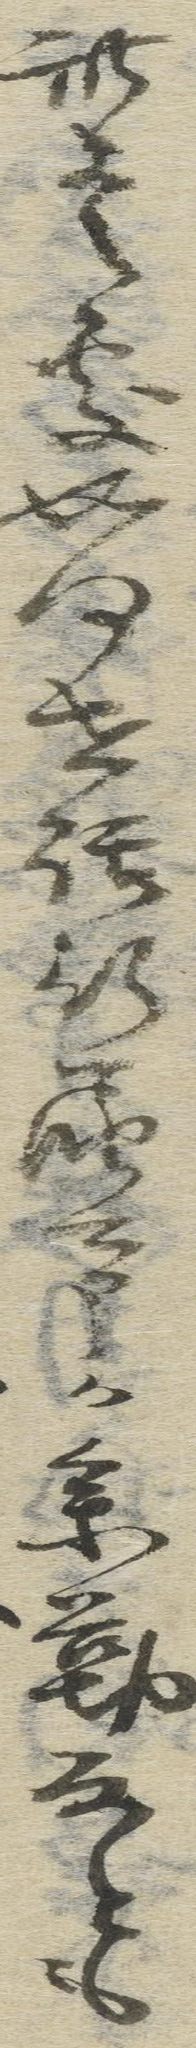此上之処如何遣続行届可申候参勤なとも
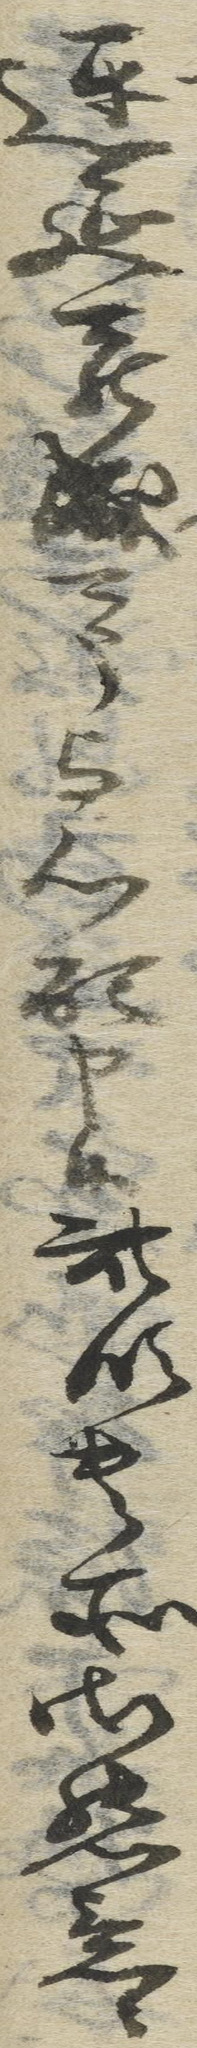遅延罷成可申と心配申候此段貴所御慈悲二
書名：信濃越後　地震書留
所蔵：東京大学地震研究所図書室 Earthquake Research Institute Library, The University of Tokyo, JAPAN
